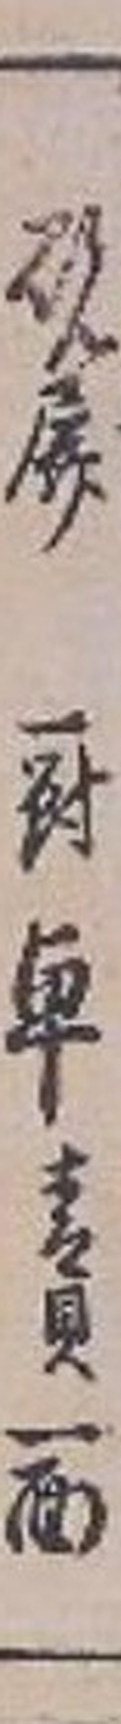硯屏一對卓青貝一面
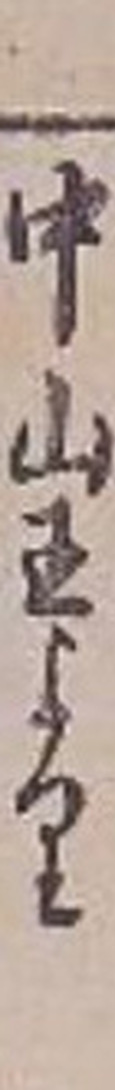中山王より
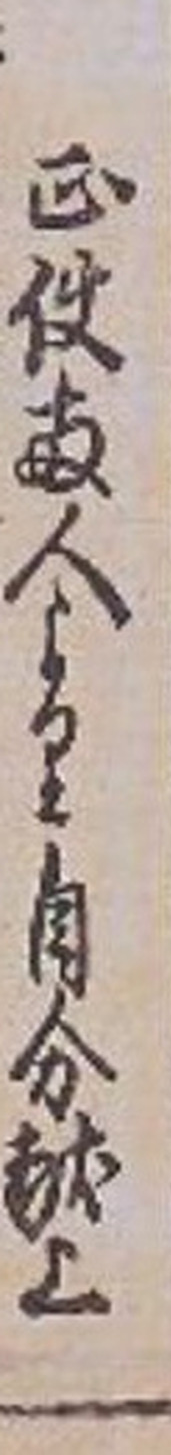正使両人より自分献上
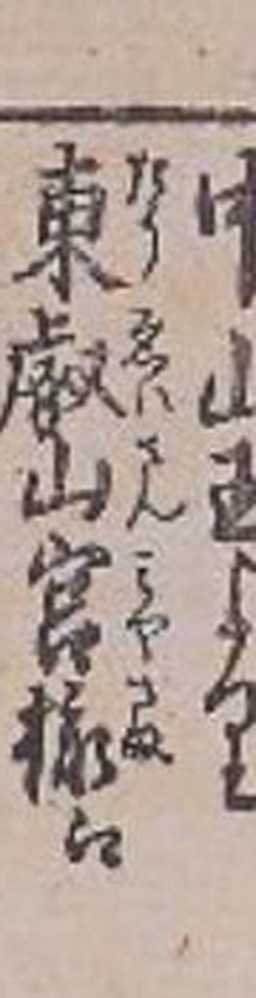東叡山宮様え
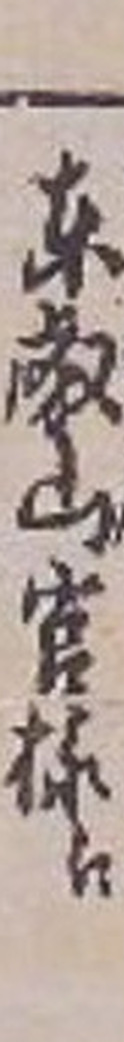東叡山宮様え
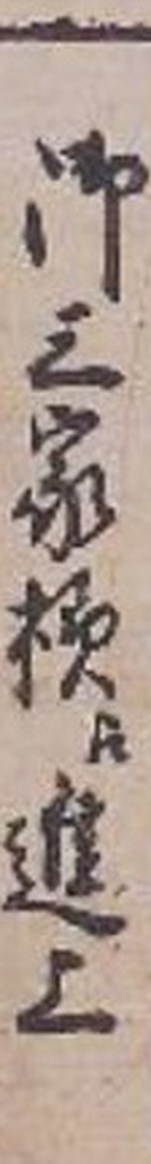御三家様え進上
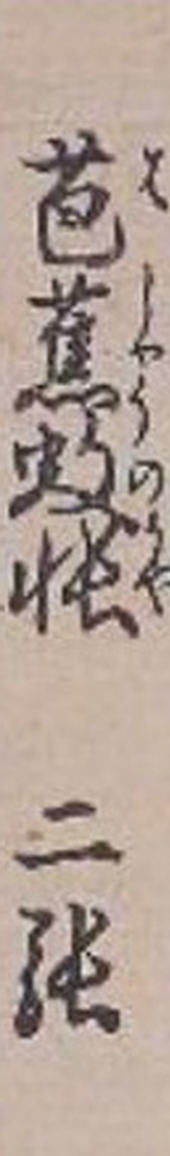芭蕉蚊帳二張
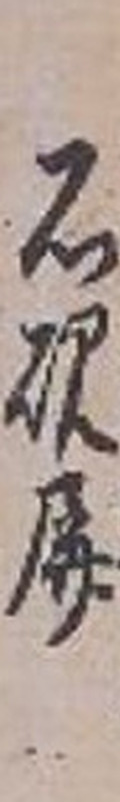石硯屏
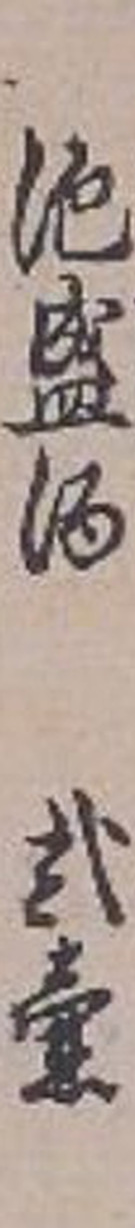泡盛酒弐壺

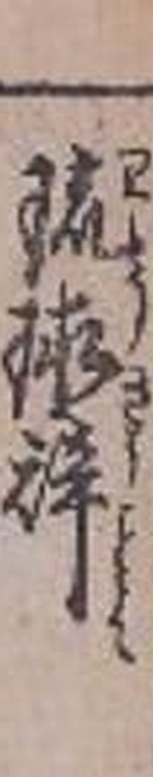琉球辞
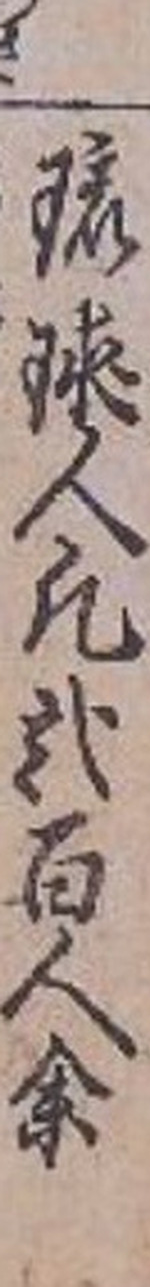琉球人凡弐百人余
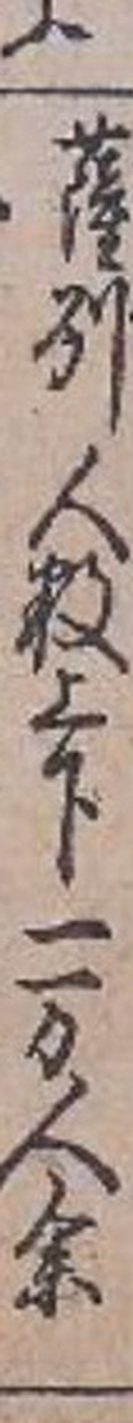薩州人数上下一万人余
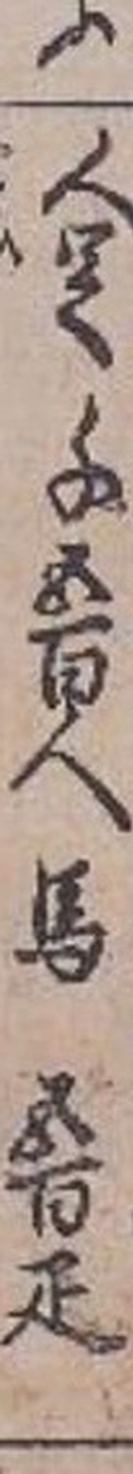人足千五百人馬五百疋
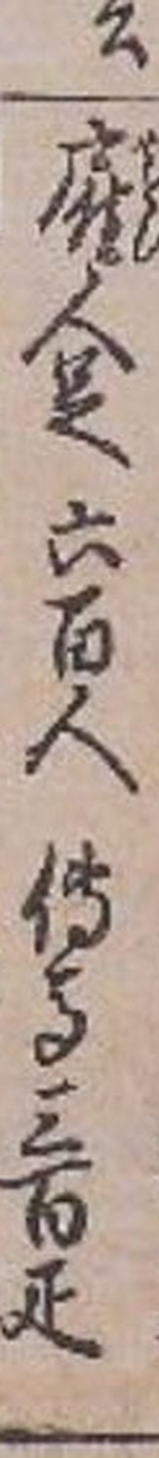雇人足六百人傳馬三百疋
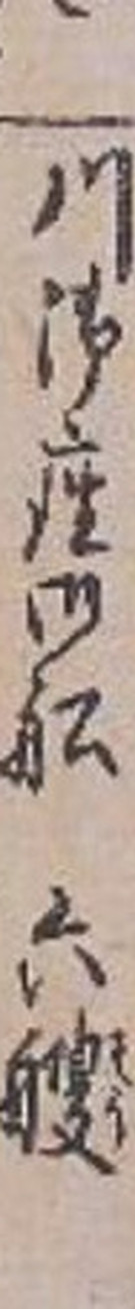川御座御船六艘
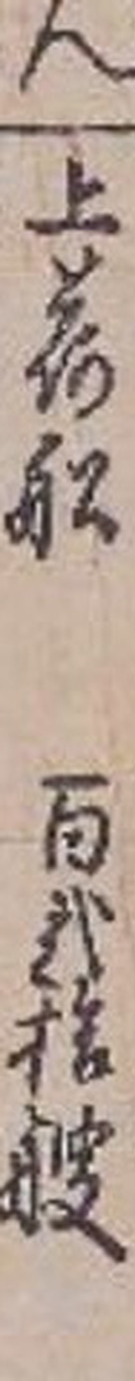上荷船百弐拾艘
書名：琉球人大行列記 大全 来朝新板絵入
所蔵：University of the Ryukyus Library
